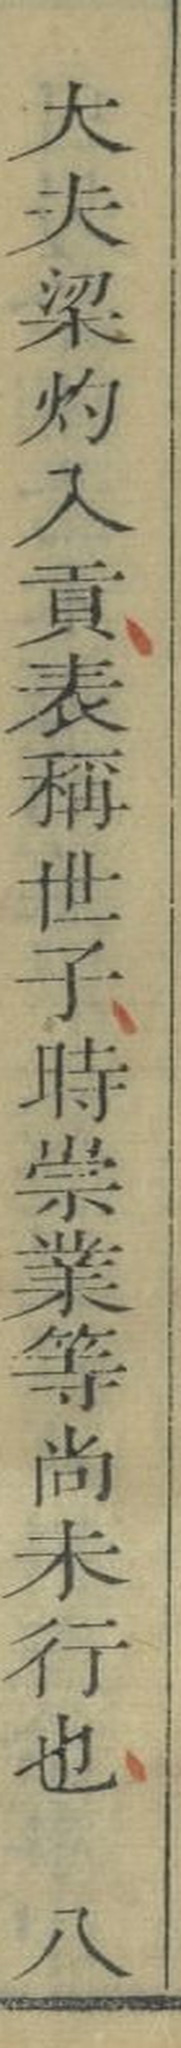大夫梁灼入貢表称世子時崇業等尚未行也八
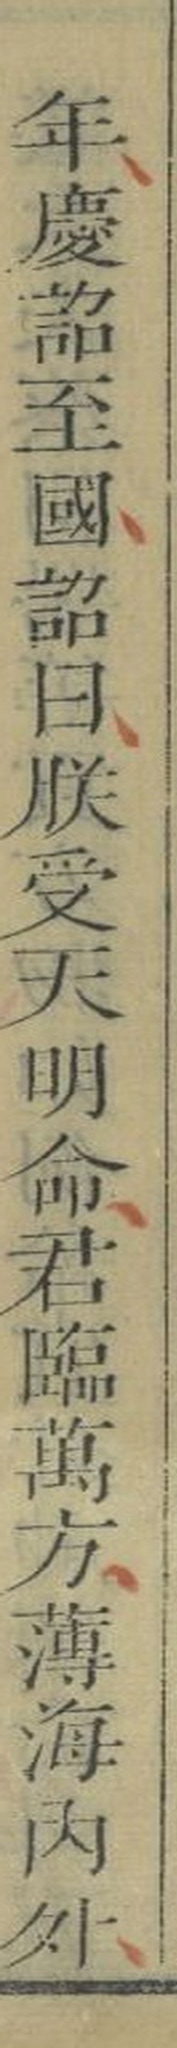年慶詔至国詔曰朕受天明命君臨万方薄海内外
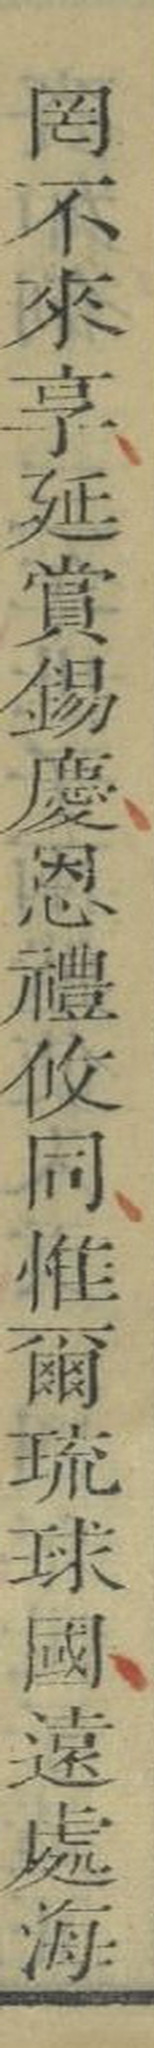罔不来享延賞錫慶恩礼攸同惟爾琉球国遠処海
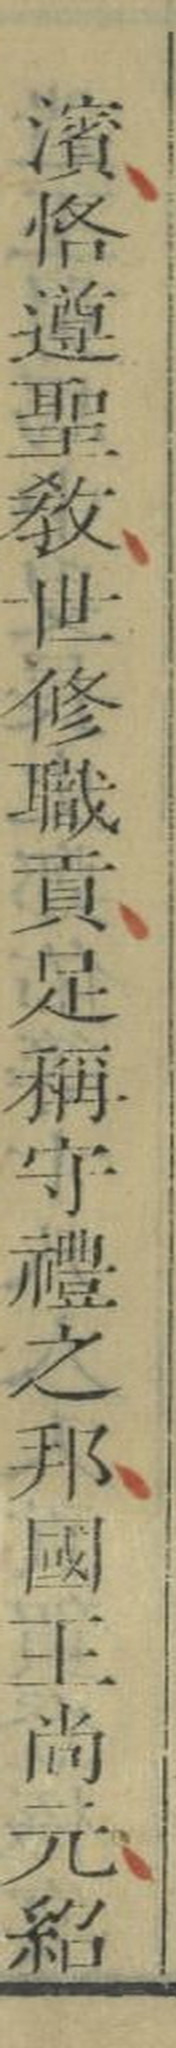浜恪遵聖教世修職貢足称守礼之邦国王尚元紹
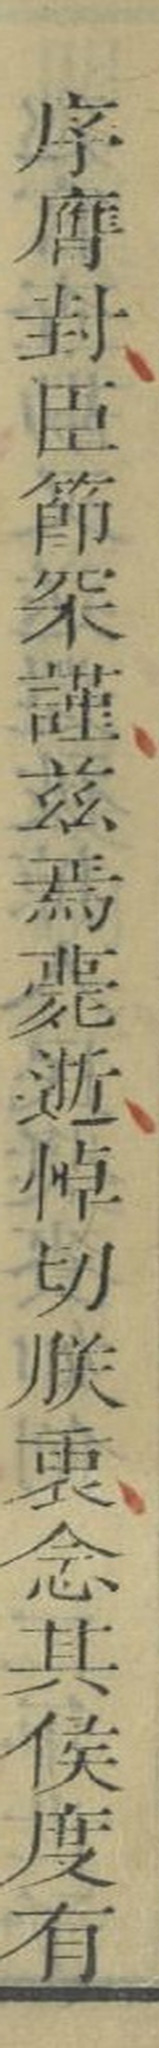序膺封臣節罙謹茲焉薨逝悼切朕衷念其侯度有
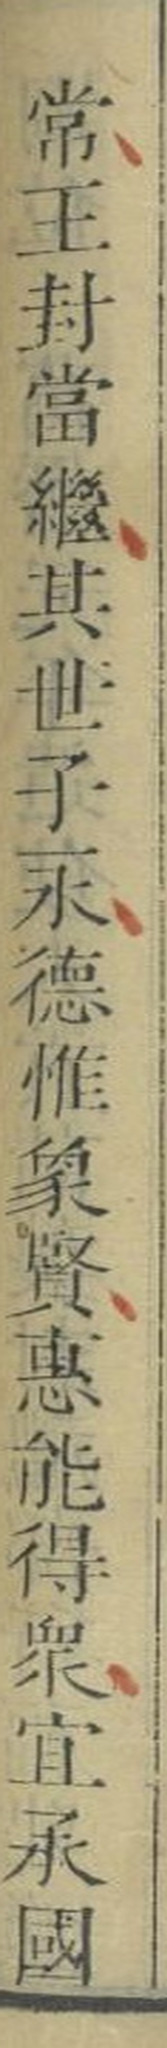常王封当継其世子永徳惟象賢恵能得衆宜承国
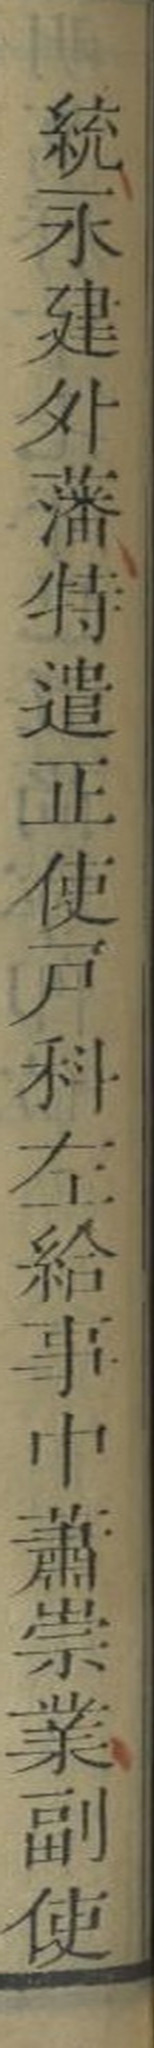統永建外藩特遣正使戸科左給事中蕭崇業副使
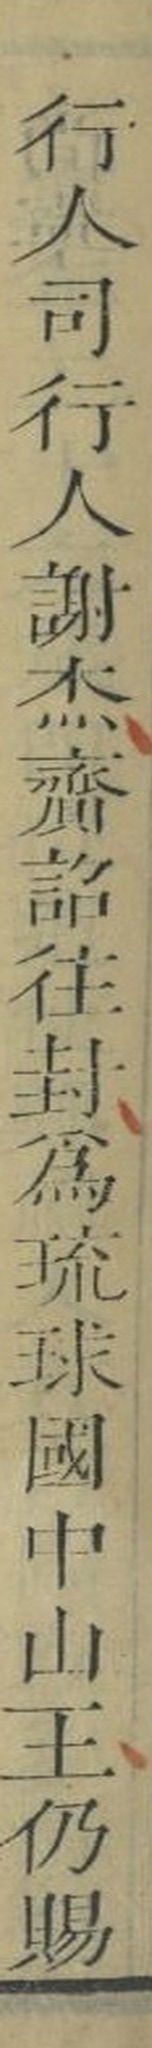行人司行人謝杰齎詔往封為琉球国中山王仍賜
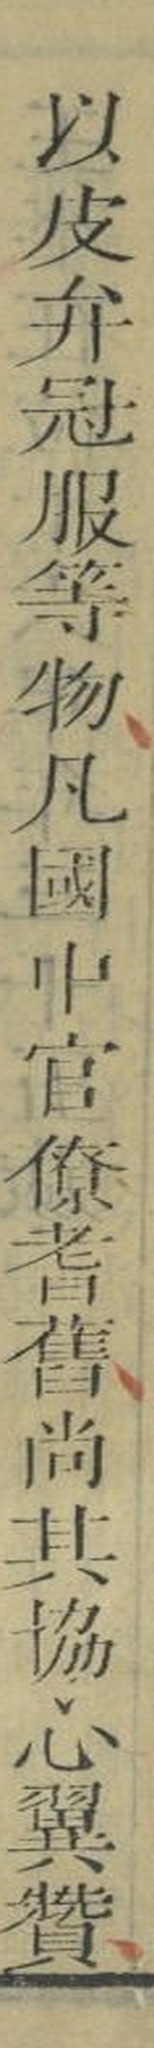以皮弁冠服等物凡国中官僚耆旧尚其協心翼賛
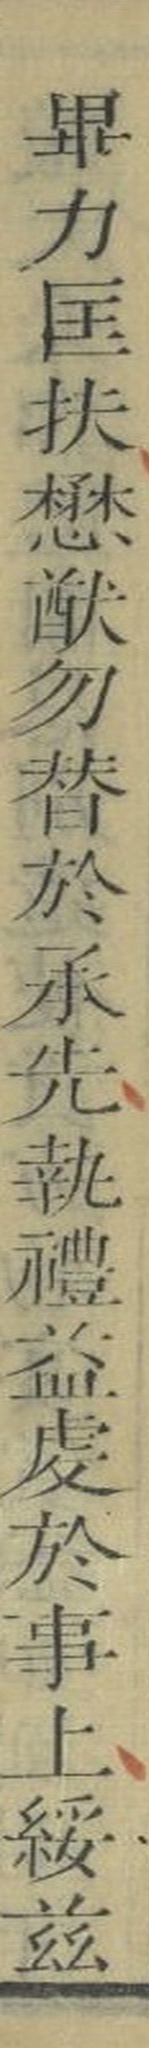畢力匡扶懋猷勿替於承先執礼益虔於事上綏茲
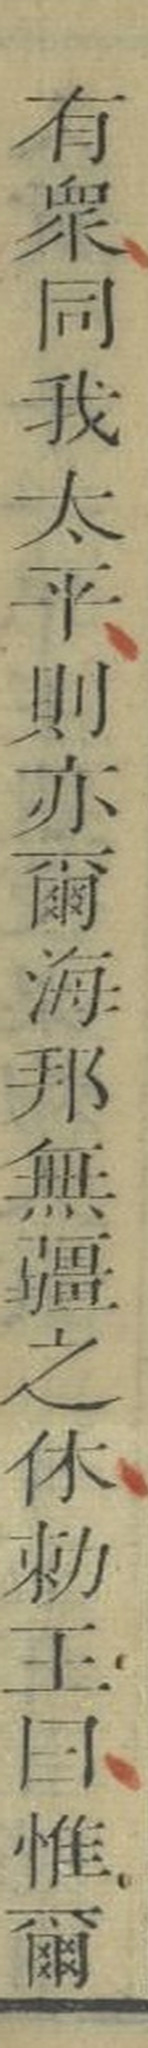有衆同我太平則亦爾海邦無疆之休勅王曰惟爾
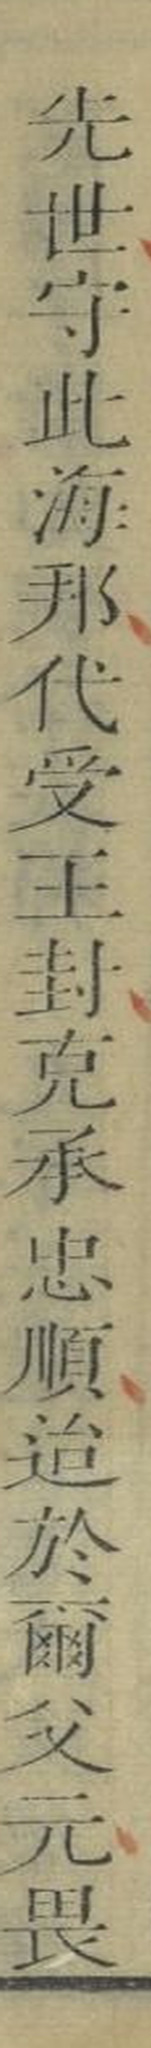先世守此海邦代受王封克承忠順迨於爾父元畏
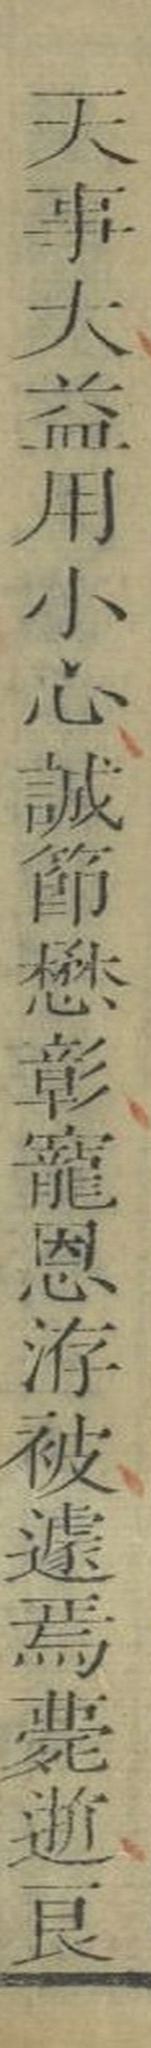天事大益用小心誠節懋彰寵恩洊被遽焉薨逝良
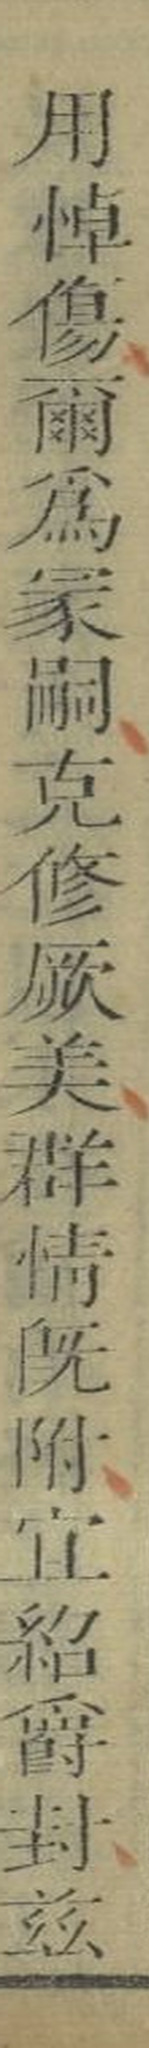用悼傷爾為冡嗣克修厥美群情既附宜紹爵封茲
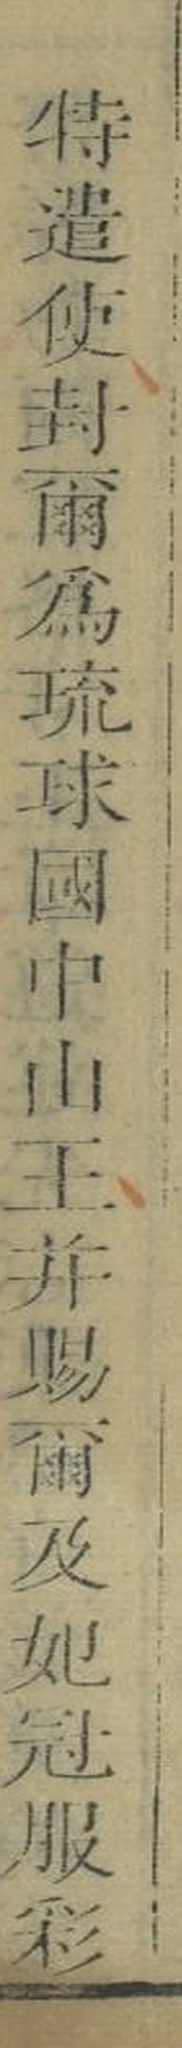特遣使封爾為琉球国中山王并賜爾及妃冠服彩

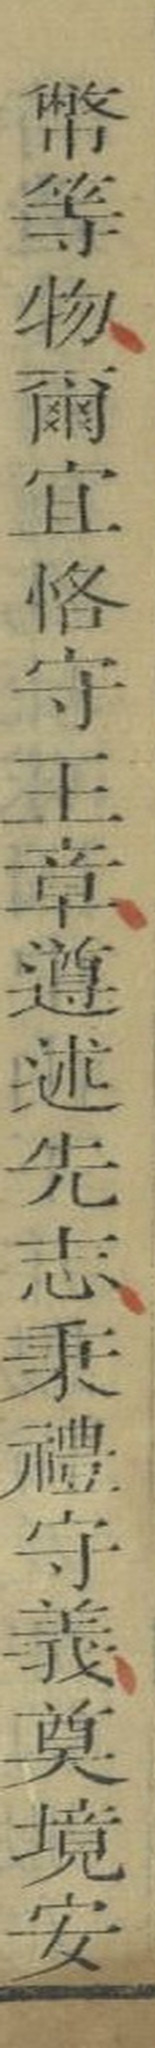幣等物爾宜恪守王章遵述先志秉礼守義奠境安
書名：中山伝信録 巻三
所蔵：University of the Ryukyus Library
